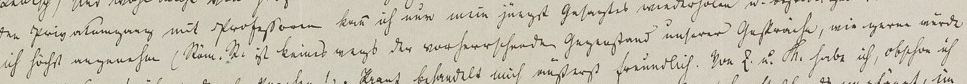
ich höchst angenehm (Röm. R. ist keineswegs der vorherrschende Gegenstand unserer Gespräche, wie gerne würde
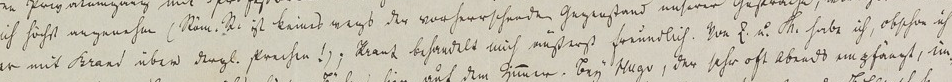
er mit Brand über dergl. sprechen!); Kraut behandelt mich äusserst freundlich. Von Z. u. Th. habe ich, obschon ich
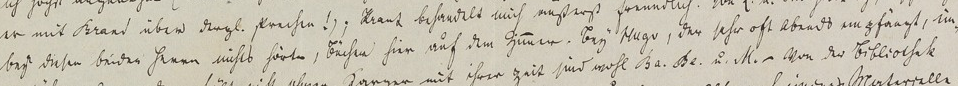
bey diesen beiden Herrn nichts hörte, Bücher hier auf dem Zimmer. Bey Hugo, der sehr oft Abends empfängt, ein-
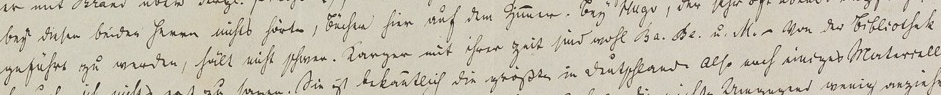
geführt zu werden, hält nicht schwer. Karger mit ihrer Zeit sind wohl Ba.Be. u. M. – Von der Bibliothek
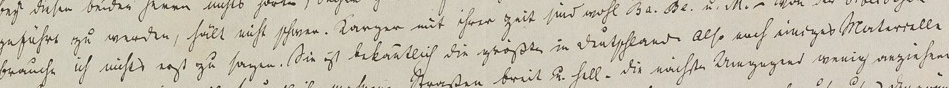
brauche ich nichts erst zu sagen. Sie ist bekanntlich die grösste in Deutschland. Also noch einiges Materielle.
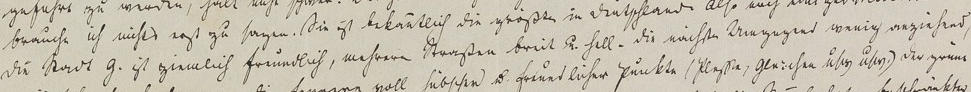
Die Stadt G. ist ziemlich freundlich, mehrere Strassen breit u. hell. Die nächste Umgegend wenig anziehend,
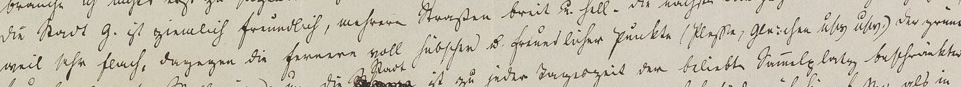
weil sehr flach, dagegen die fernere voll hübscher u. freundlicher Punkte (Plesse, Gleichen usw usw.) Der grüne
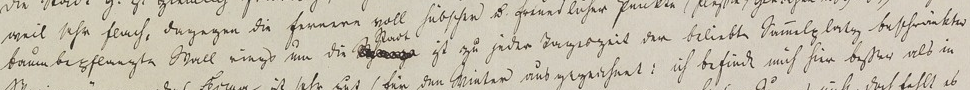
kaum bepflanzte Wall rings um die ...Stadt ist zu jeder Tageszeit der beliebte Sammelplatz beschränkter
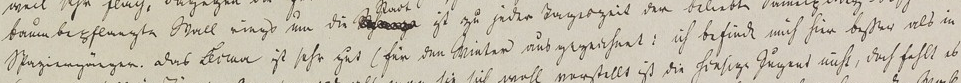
Spaziergänger. Das Clima ist sehr gut (für den Winter ausgezeichnet: ich befinde mich hier besser als in
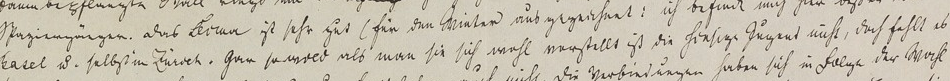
Basel u. selbst in Zürich. Gar so wild als man sie sich wohl vorstellt ist die hiesige Jugend nicht, doch fehlt es
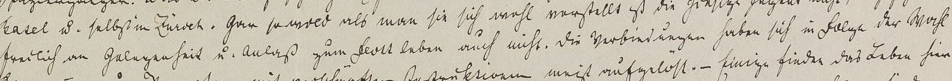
freilich an Gelegenheit u. Anlass zum flott leben auch nicht. Die Verbindungen haben sich in Folge der Wahl
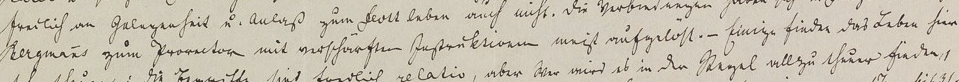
Bergmanns zum Prorector mit verschärften Instruktionen meist aufgelöst. – Einige finden das Leben hier
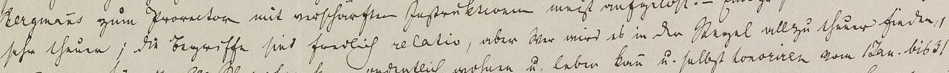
sehr theuer; die Begriffe sind freilich relativ, aber Wer wird es in der Regel allzu theuer finden,
